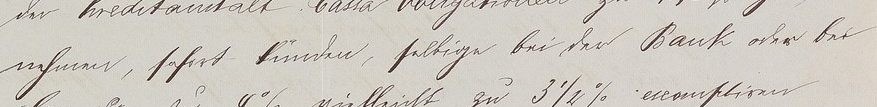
nehmen, sofort künden, selbige bei der Bank oder bei
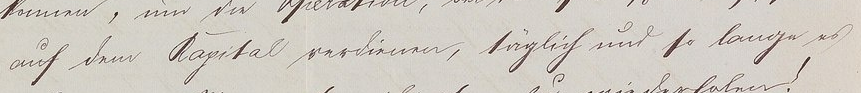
auf dem Kapital verdienen, täglich und so lange es
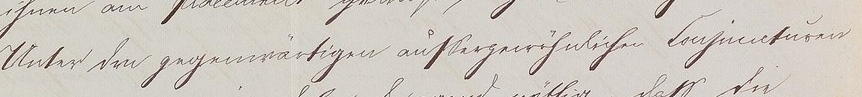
Unter den gegenwärtigen außergewöhnlichen Conjuncturen
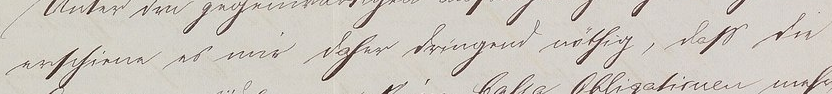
erschiene es mir daher dringend nöthig, daß die
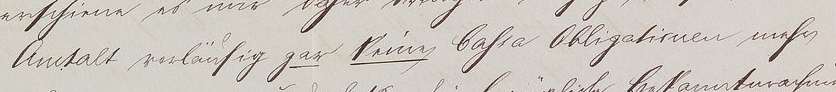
Anstalt vorläufig gar keine Cassa Obligationen mehr
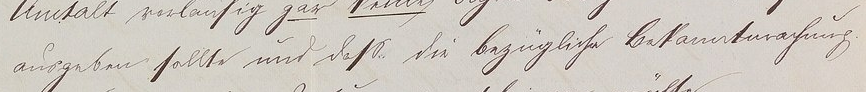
ausgeben sollte und daß die bezügliche Bekanntmachung
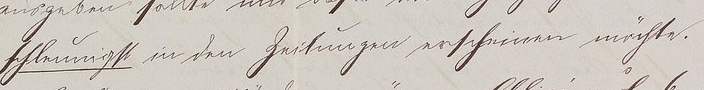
schleunigst in den Zeitungen erscheinen möchte.
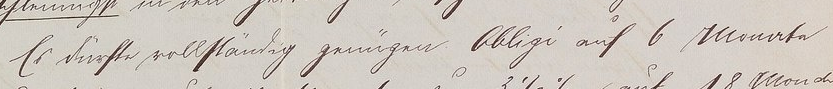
Es dürfte vollständig genügen Obligi auf 6 Monate
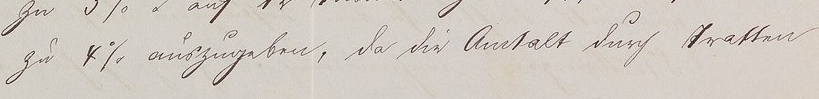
zu 4% auszugeben, da die Anstalt durch Tratten
